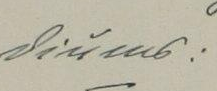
diums:
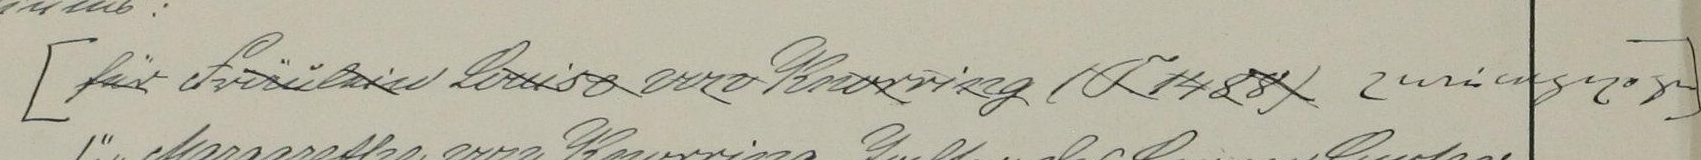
[für Fräulein Louise von Knorring (T.1488) zurückgezogen]
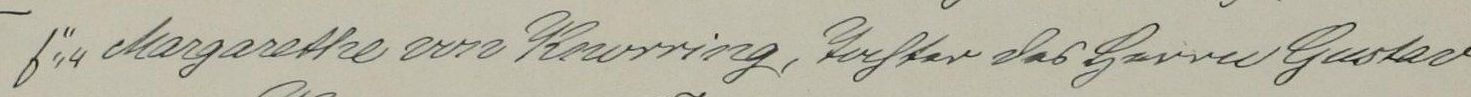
für Margarethe von Knorring, Tochter des Herrn Gustav
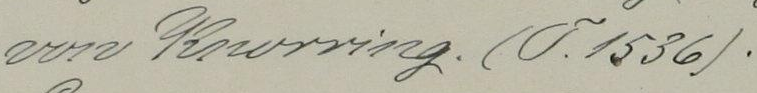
von Knorring (T.1536)
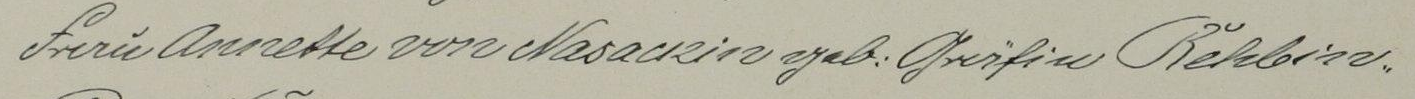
Frau Annette von Nasackin, geb. Gräfin Rehbin-
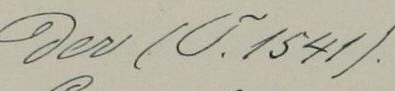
der (T.1541)
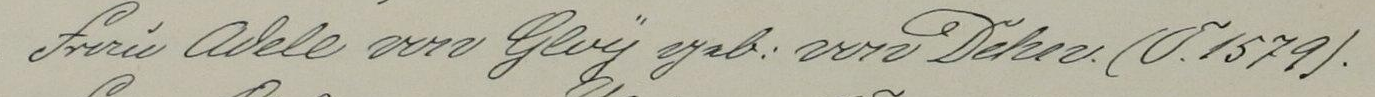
Frau Adele von Gloy, geb. von Dehn (T.1579)
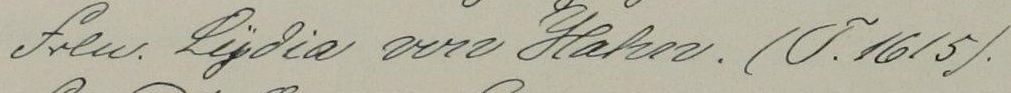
Frln. Lydia von Hahn (T.1615)
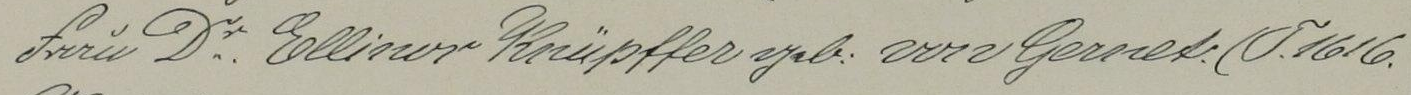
Frau Dr. Ellinor Knüpffer, geb. von Gernet (T.1616;
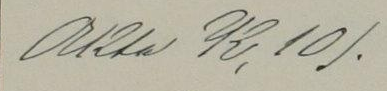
Akte K.10)
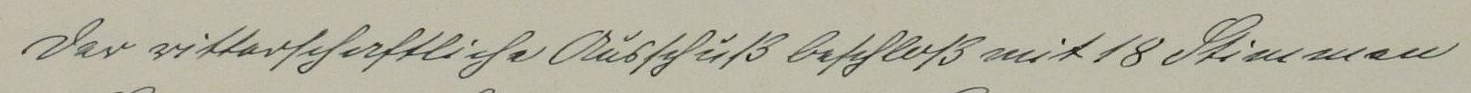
Der ritterschaftliche Ausschuß beschloß mit 18 Stimmen
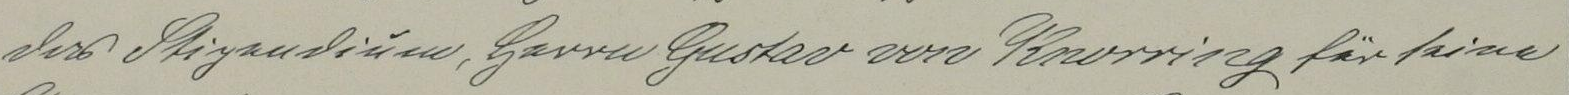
das Stipendium, Herrn Gustav von Knorring für seine
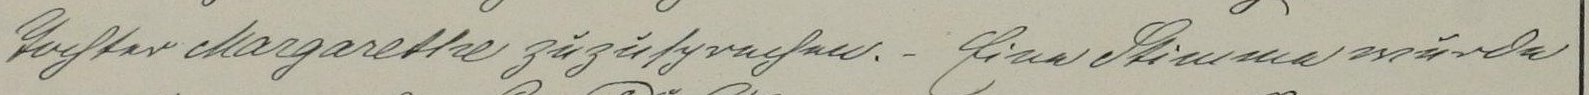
Tochter Margarethe zuzusprechen. Eine Stimme wurde
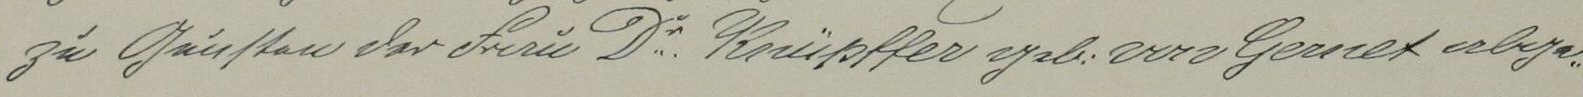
zu Gunsten der Frau Dr. Knüpffer geb. von Gernet abge-
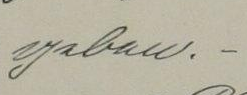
geben.
